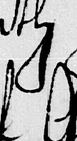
d.
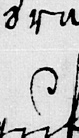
M.
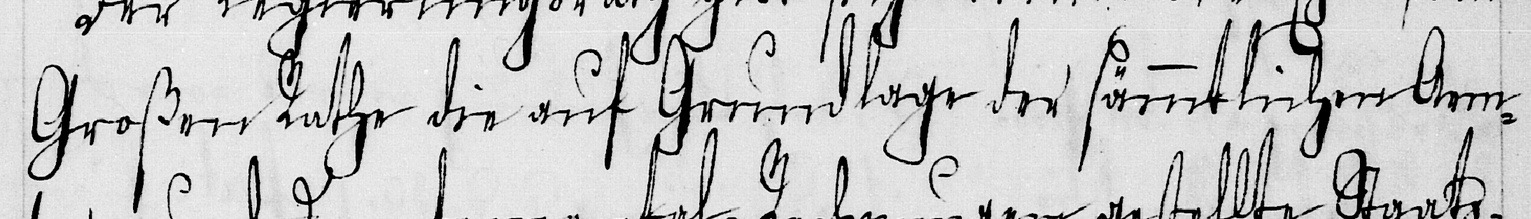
Großen Rathe die auf Grundlage der sämmtlichen Aem¬
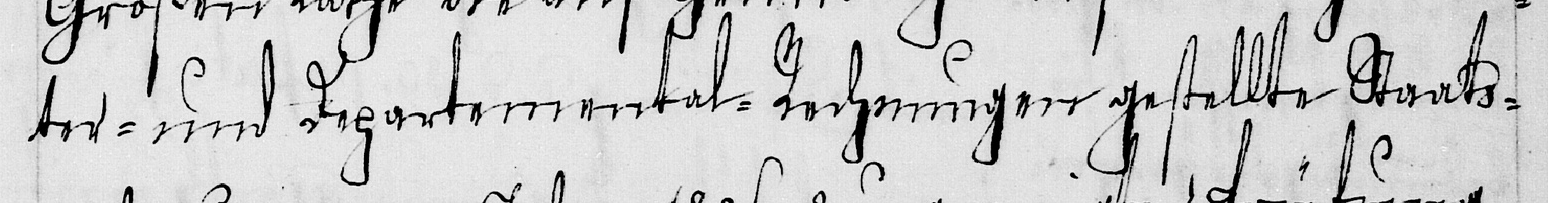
ter- und Departemental-Rechnungen gestellte Staats¬
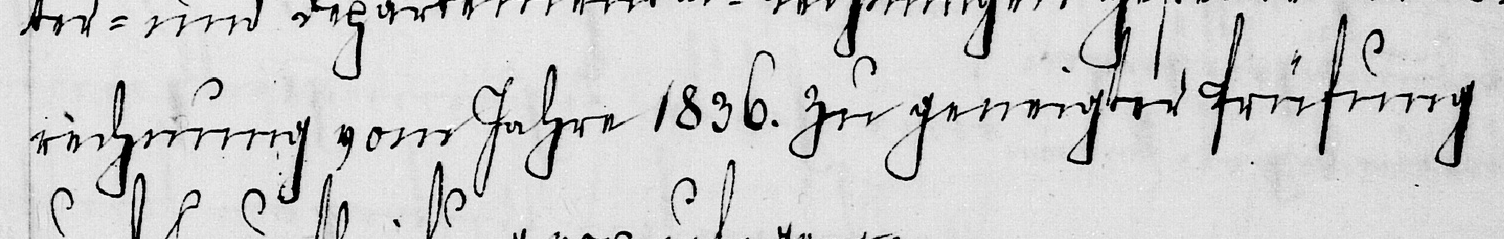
rechnung vom Jahre 1836. zu geneigter Prüfung
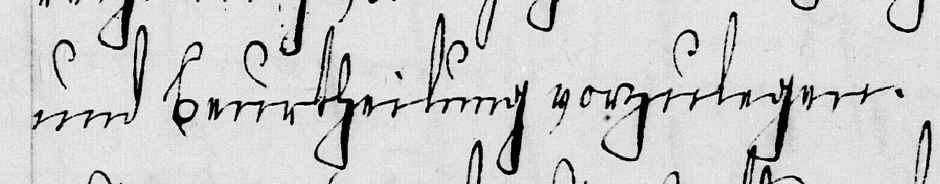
und Beurtheilung vorzulegen.
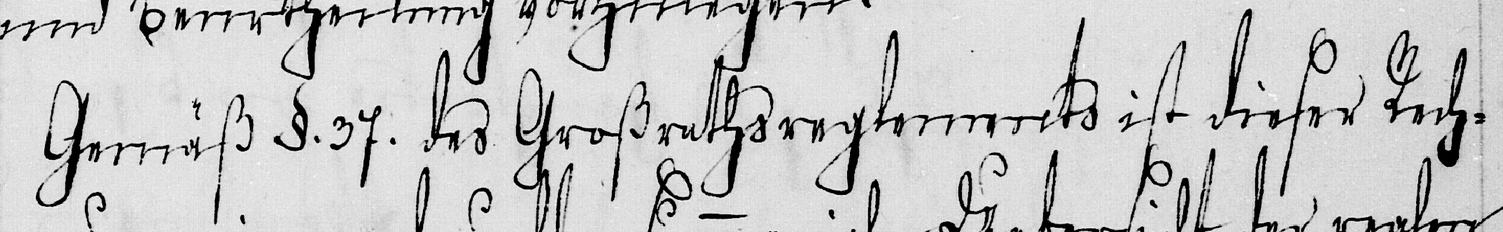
Gemäß §. 37. des Großrathsreglements ist dieser Rech¬
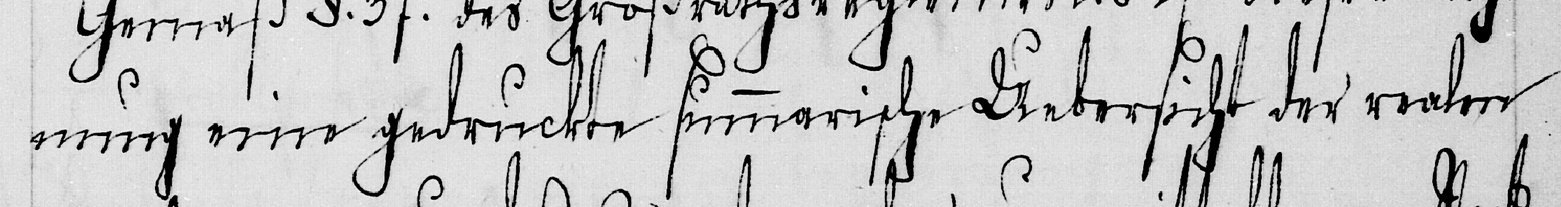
nung eine gedruckte summarische Uebersicht der realen
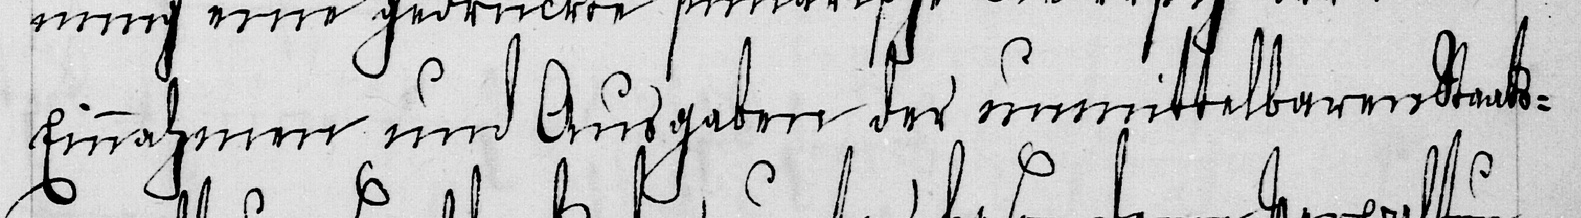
Einnahmen und Ausgaben der unmittelbaren Staats¬
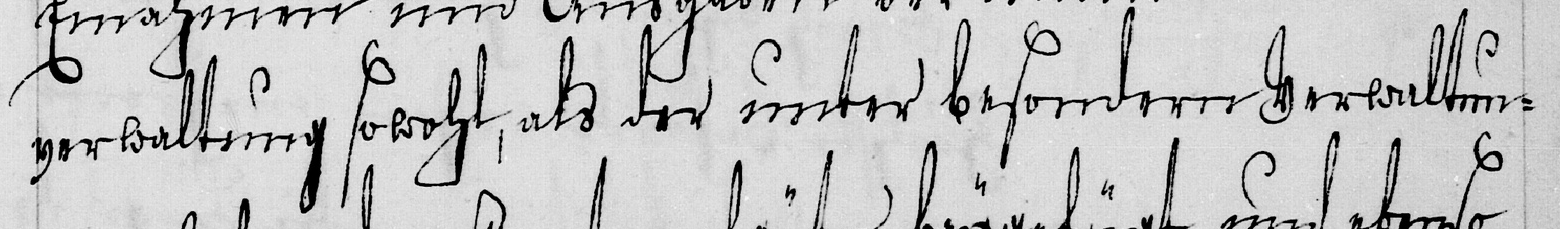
verwaltung sowohl, als der unter besondern Verwaltun¬
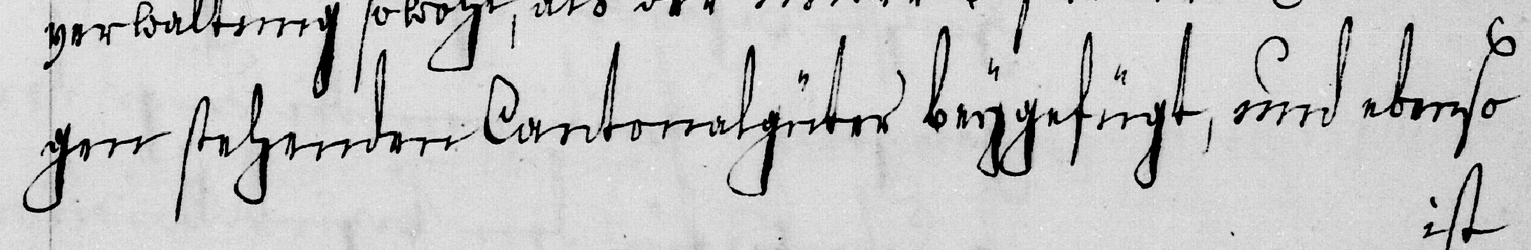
gen stehenden Cantonalgüter beygefügt, und ebenso
